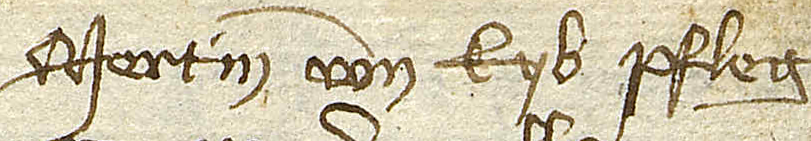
Mertin von Eyb pfleg*
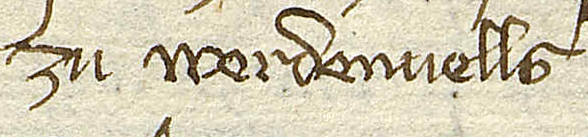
ʒu werdenuells
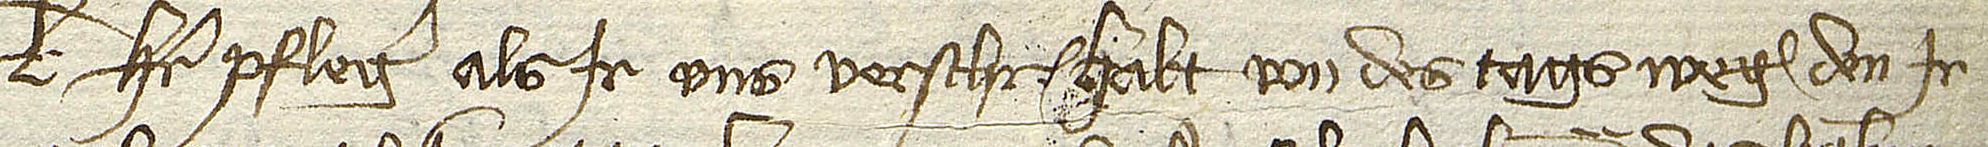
L* Hr* plfeg* als Ir vns verſchr* habt von des tags weg* den Ir
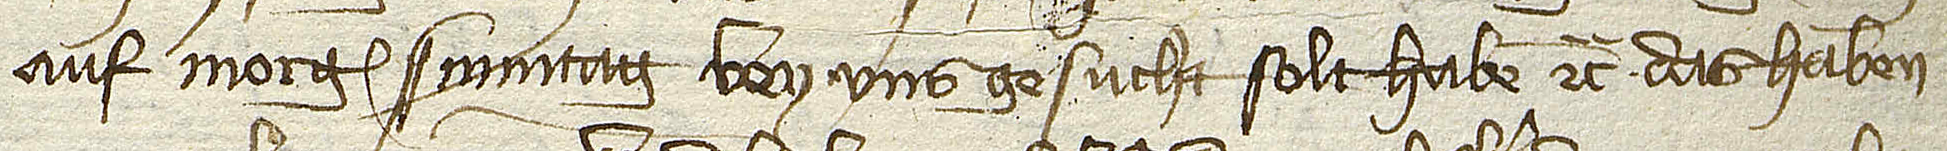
auf morg* ſunntag bey vns geſucht ſolt habe* ec* . das haben
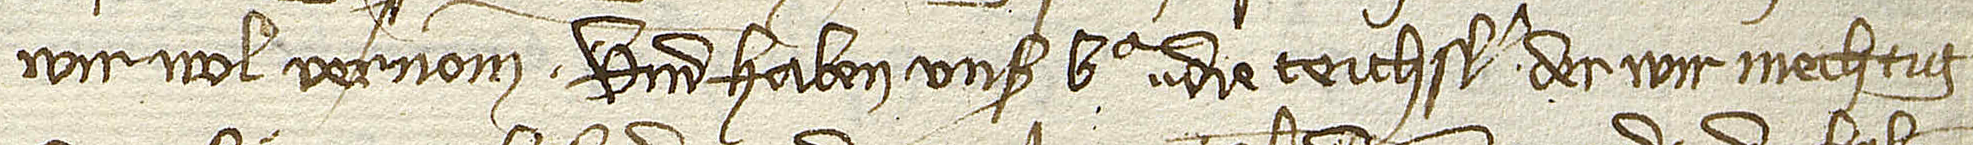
wir wol vernom* . Vnd haben vnſ* b* ~ die teichſl* . der wir mechtig
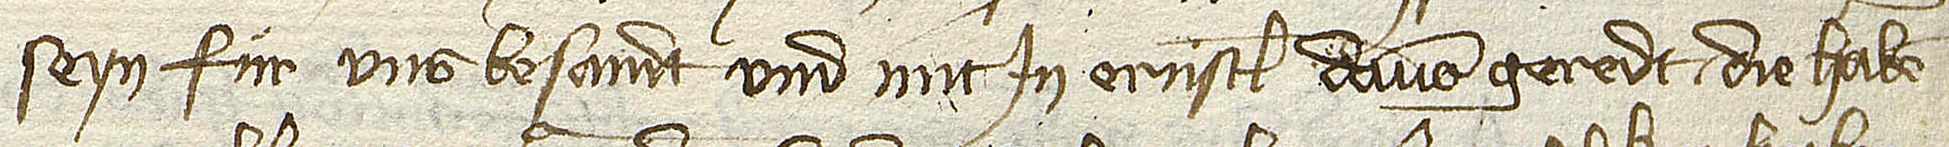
ſeyn für vns beſandt vnd mit In ernſtl* dauo* geredt / die habe*
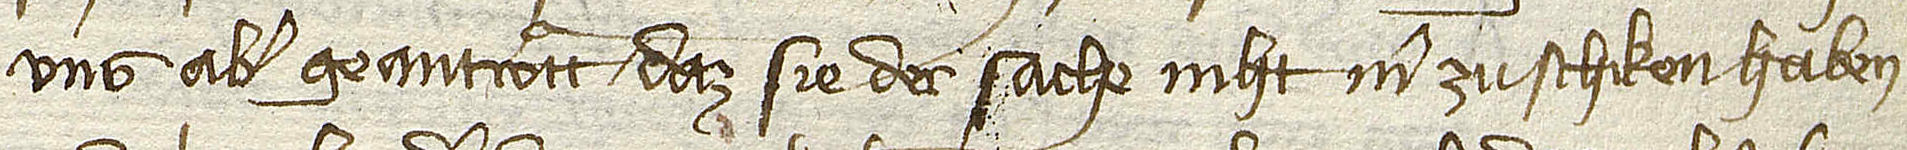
vns ab* geantw*tt / daʒ ſie der ſache niht m* ʒuſchiken haben
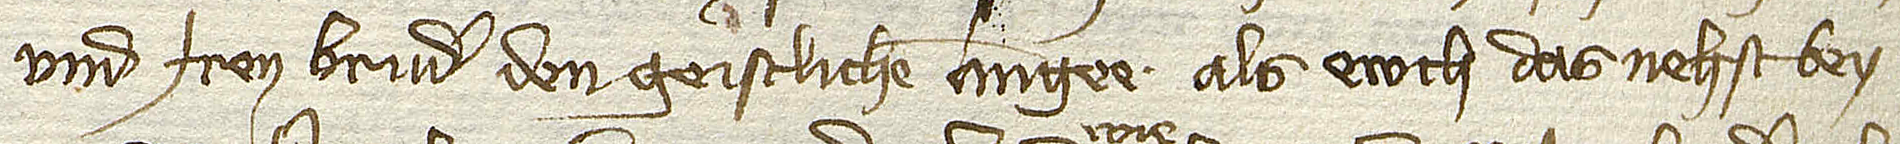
vnd Iren brud* den geiſtliche* angee . als ewch das nehſt bey
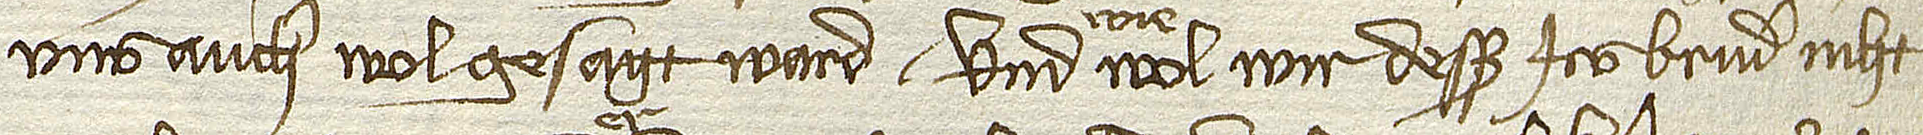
vns auch wol geſagt ward / Vnd wol wir deſſ* Irs brud* niht
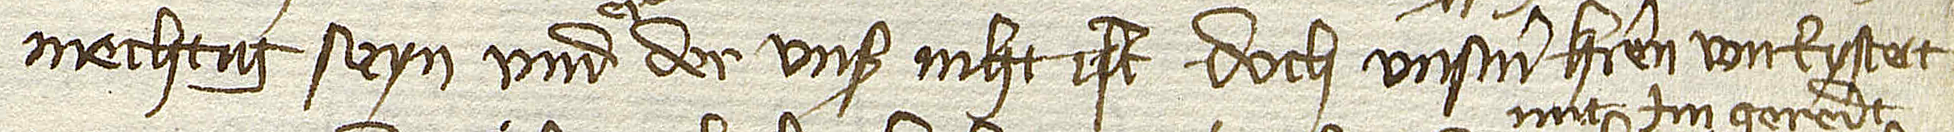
mechtig ſeyn vnd der vnſ* niht iſt doch vnſ*m h*ren von Eyſtett
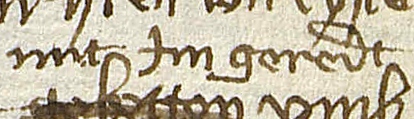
mit Im geredt
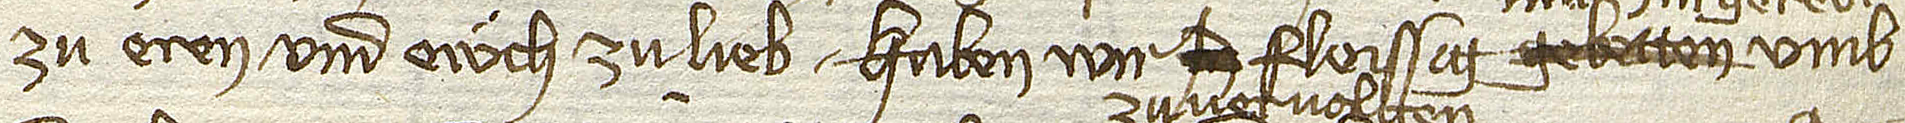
ʒu eren vnd ewch ʒu lieb / haben wir In fleiſſig gebetten vmb
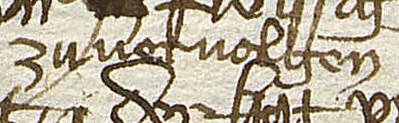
ʒu ueruolgen
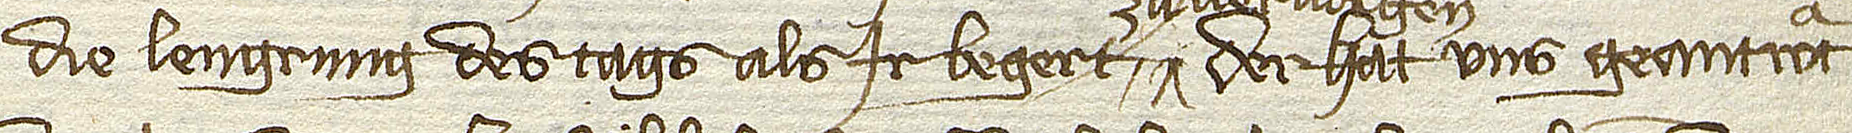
die lengrung des tags als Ir begert der hat vns geantw*t
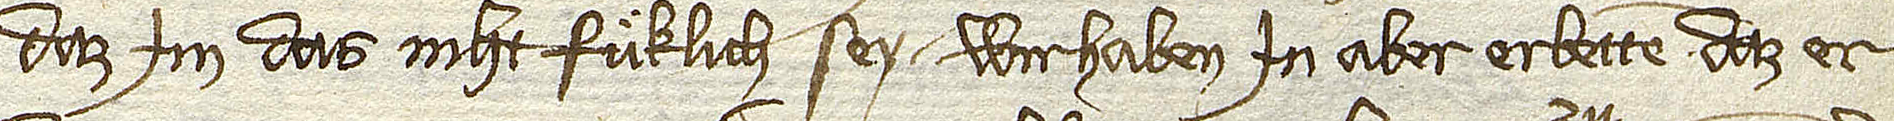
daʒ Im das niht füklich ſey / Wir haben In aber erbette* . daʒ er
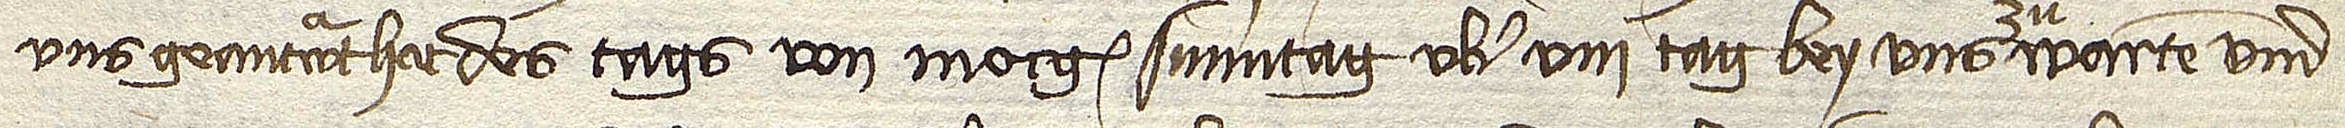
vns geantw*t hat des tags von morg* ſunntag vb* viii tag bey vns warte* vnd
